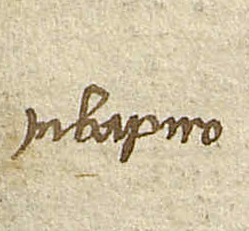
In bapiro
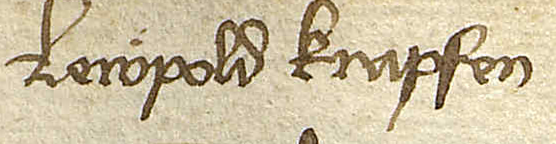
Lewpold krapfen
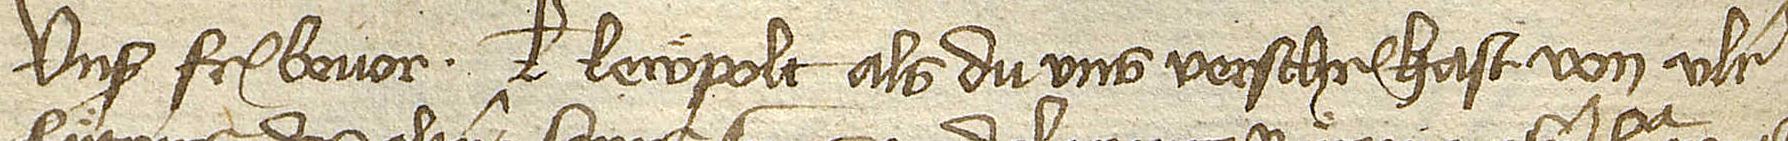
Vnſ* fr* beuor . L* lewpolt als du vns verſchr* haſt von vlr*
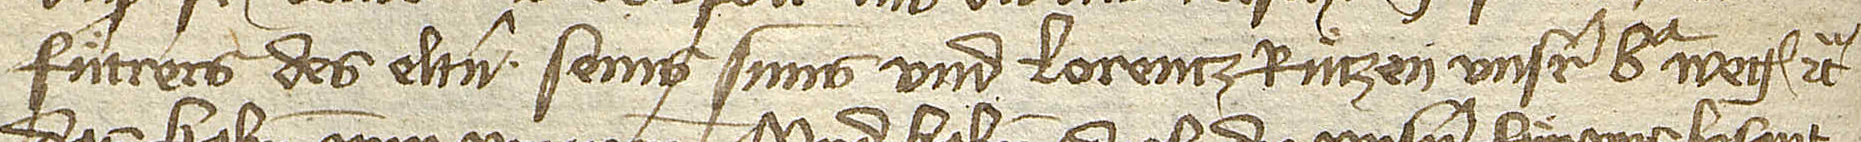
fütrers des eltn* . ſeins vnd lorencʒ Rücʒen vnſ*r b* weg* ec*
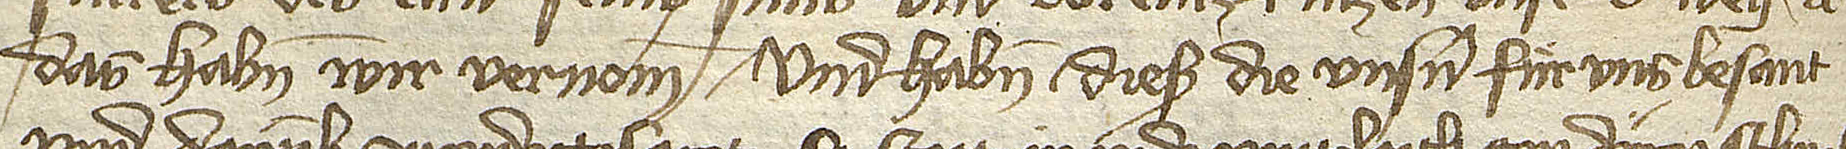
das habn* wir vernom* / Vnd hab* / dieſ* die vnſ*n für vns beſant
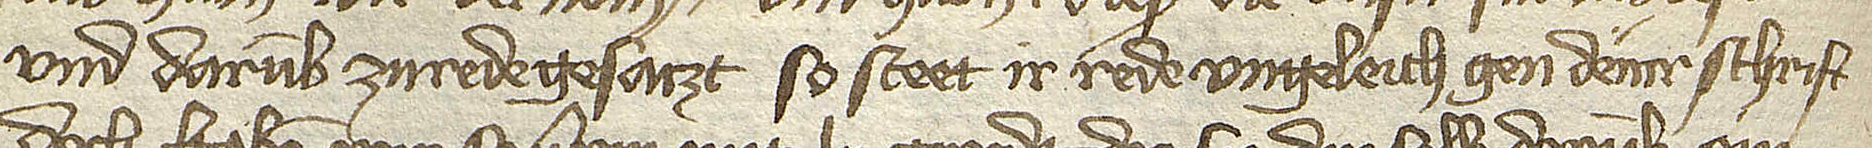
vnd daru*b cʒurede geſacʒt ſo ſteet ir rede vngeleich gen deinr ſchrift
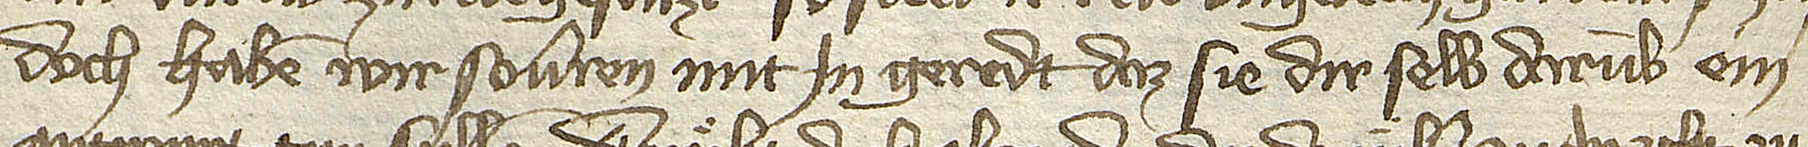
doch habe* wir ſou*ren mit In geredt daʒ ſie dir ſelb daru*b ein
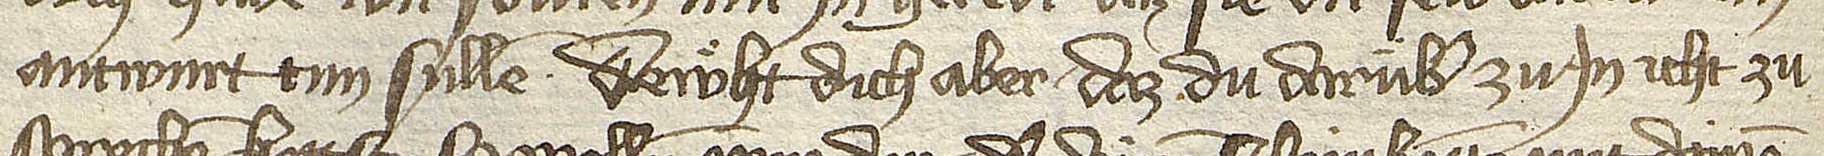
antwurt tun ſulle* . Dewht dich aber / daʒ du darüb* ʒu In icht ʒu
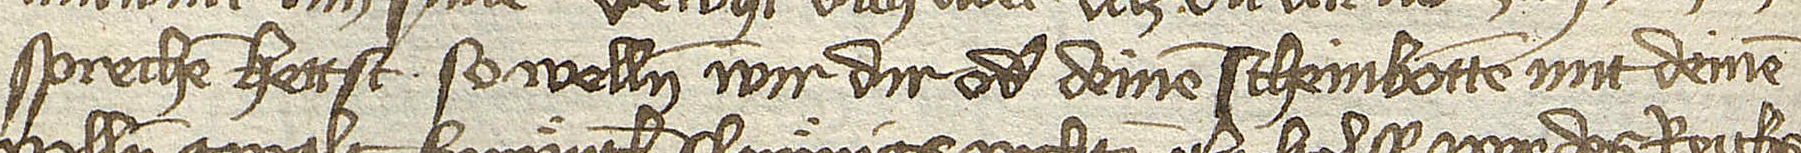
ſprehe* hettſt . ſo welln* wir dir od* deine* ſcheinbotte* mit deine*
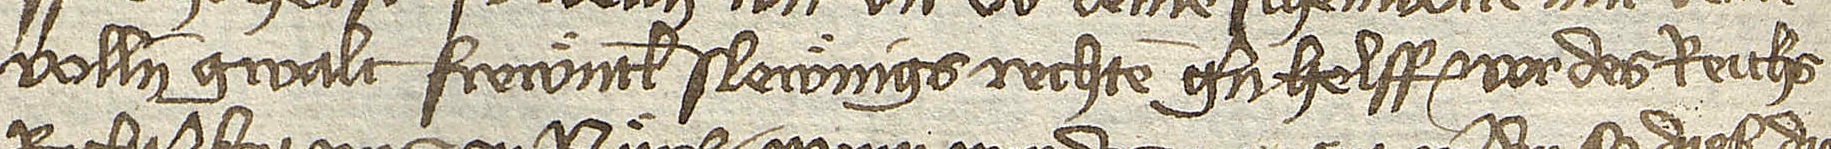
volln* gwalt frewntl* ſlewnigs rechte* g*n helff* vor des Reichs
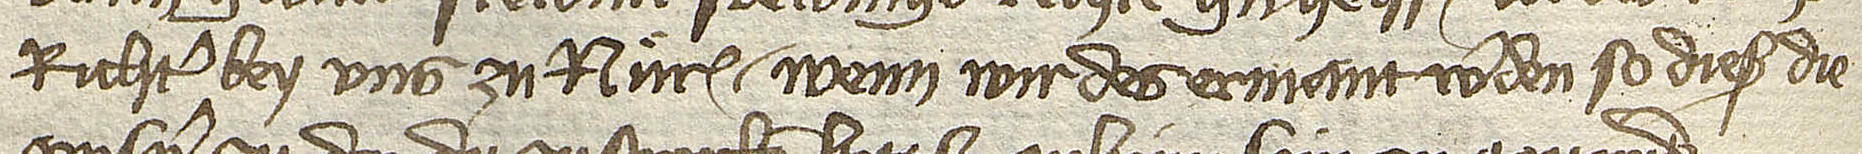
Richt* bey vns ʒu Nür* / wenn wir des ermant w*den ſo dieſ* die
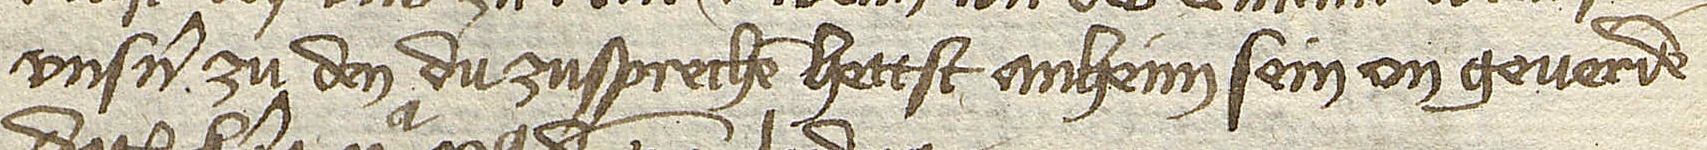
vnſn* ʒu den du ʒuſpreche* hettſt anheim ſein on geuerde
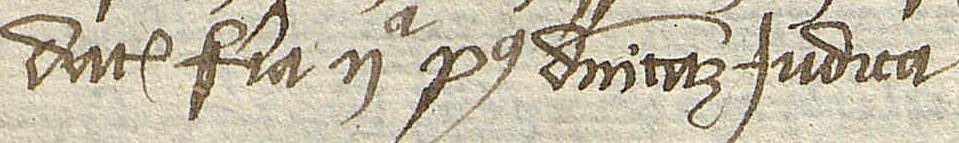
Dat* f*ia ii* p* dnica* Iudica*
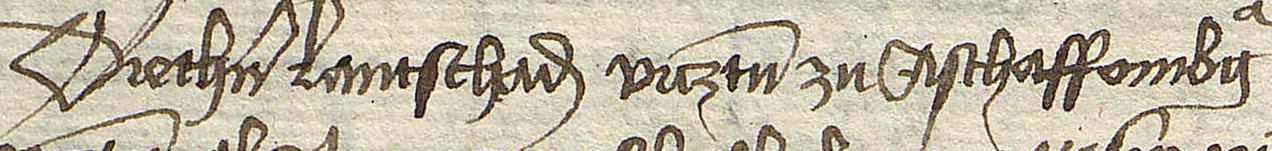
Diethn* lantschad* vicʒtu* ʒu Aſchaffembg*
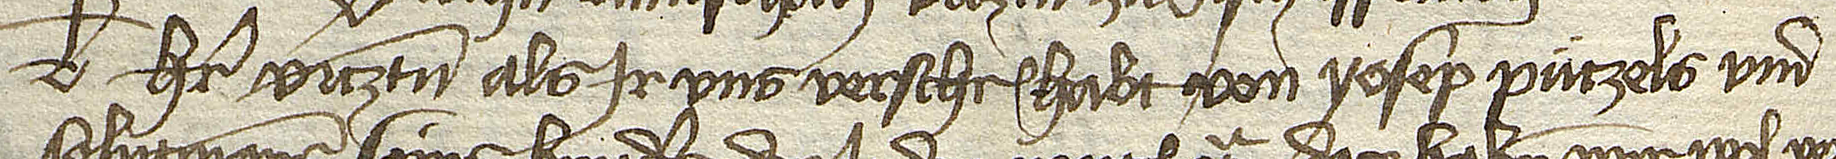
L* hr* vicʒtu* als Ir vns verſchr* habt von Yoſep Pücʒels vnd
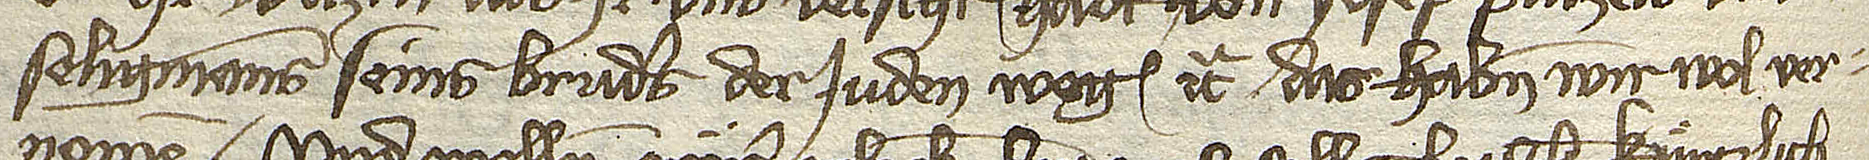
ſeligmans* ſeins brud*s der Iuden weg* ec* das habn* wir wol ver =
